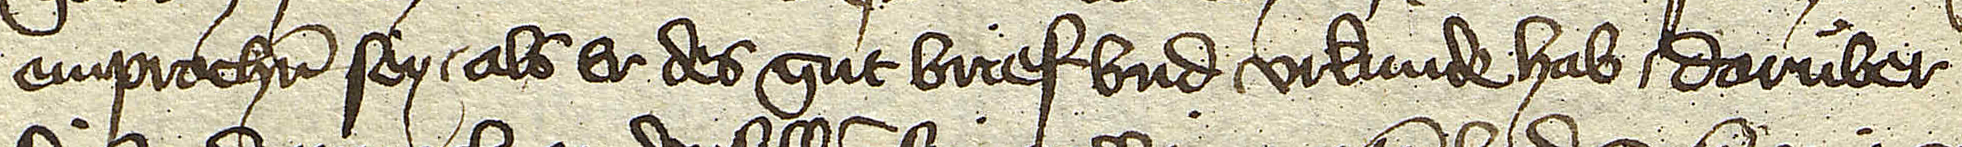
einprochn* ſey / als Er des gut brief vnd vrkunde hab / darüber
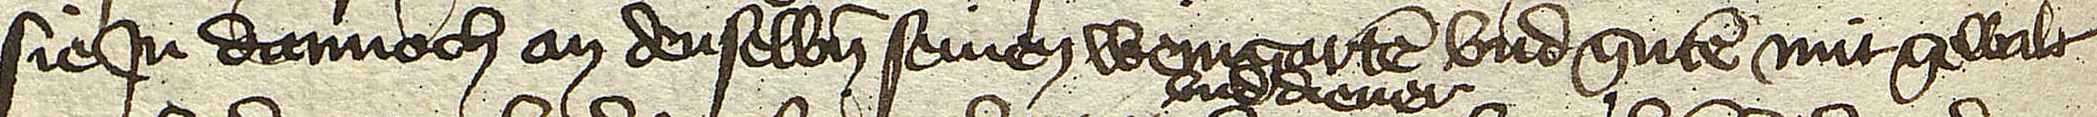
ſie In dannoch an denſelbn* ſeinen weingarte* vnd gute* mit gewalt
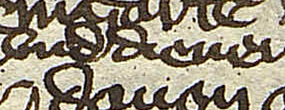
vnd diener
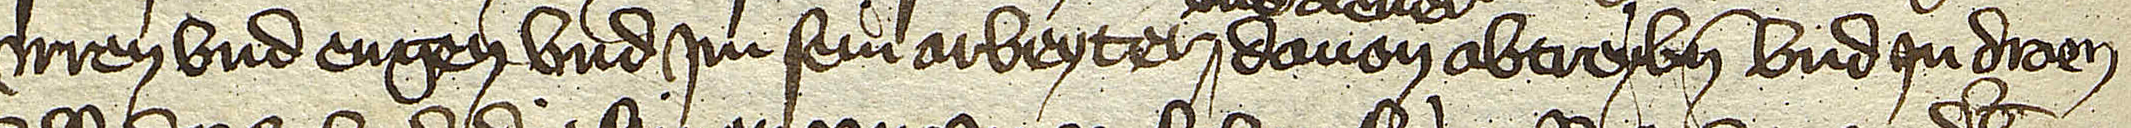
irren vnd engen vnd Im ſein arbeyter dauon abtreybn* vnd In droen
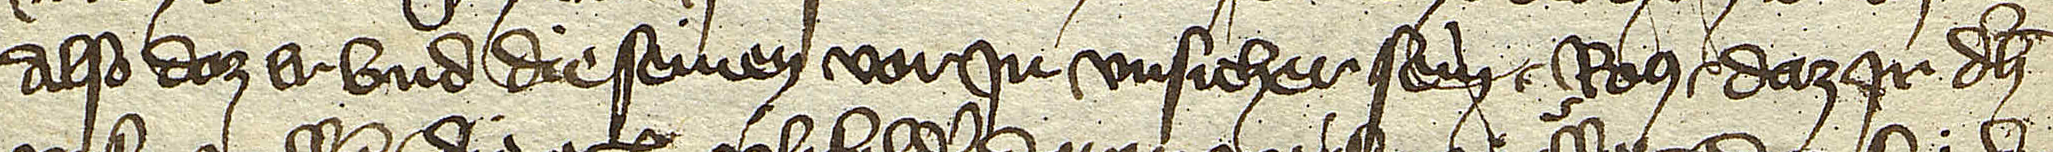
Alſo daʒ Er vnd die ſeinen vor In vnſicher ſein / Ro* / daʒ Ir d*h
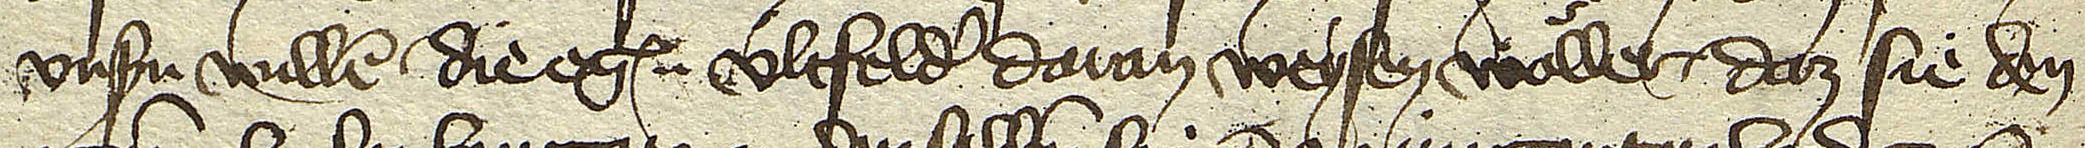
vnſ*n wille* die eg* ~ vltfeld* daran weyſen wöllet / daʒ ſie den
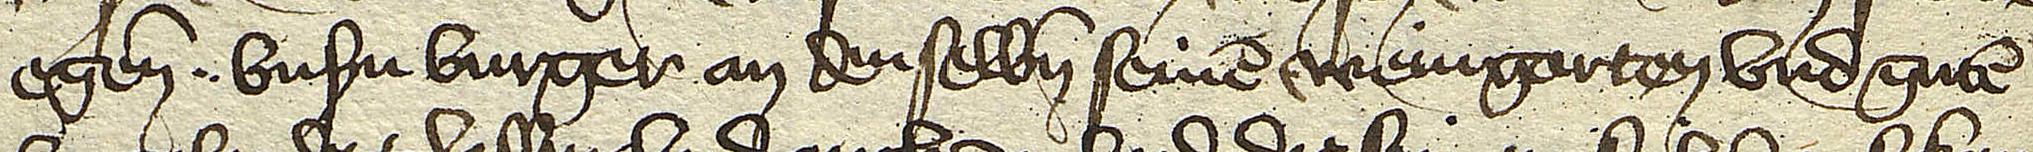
egen* ~ vnſ*n burger an den ſelbn* ſeine* weingarten vnd gute*
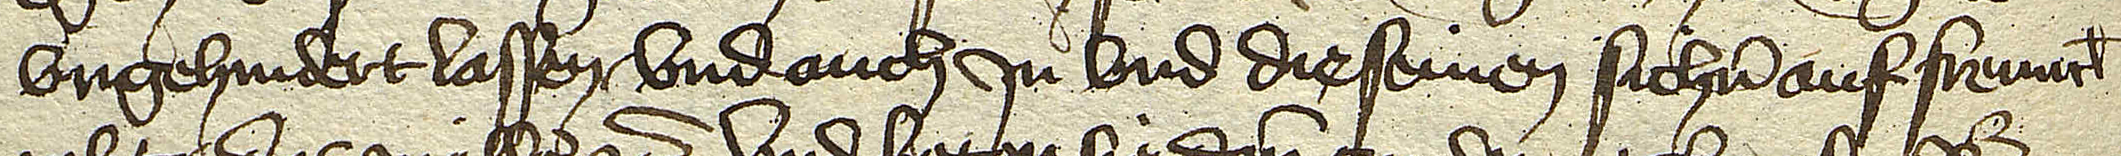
vngehindert laſſen / vnd auch In vnd die ſeinen ſichn* auf freuntl*
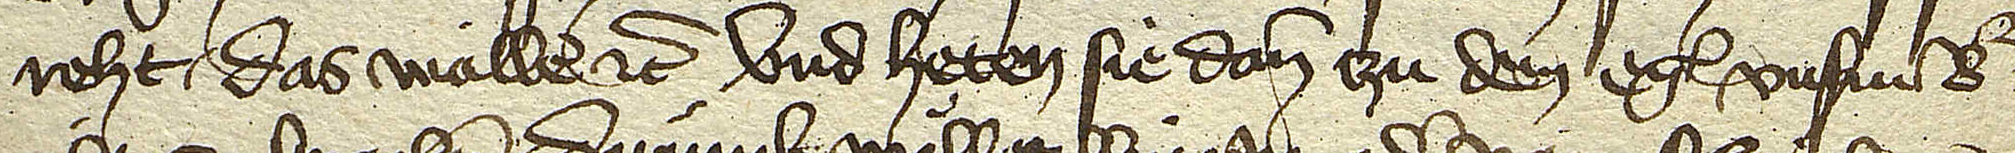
reht / Das wölle* ec* vnd heten ſie dan* cʒu dem eg* vnſ*m B*
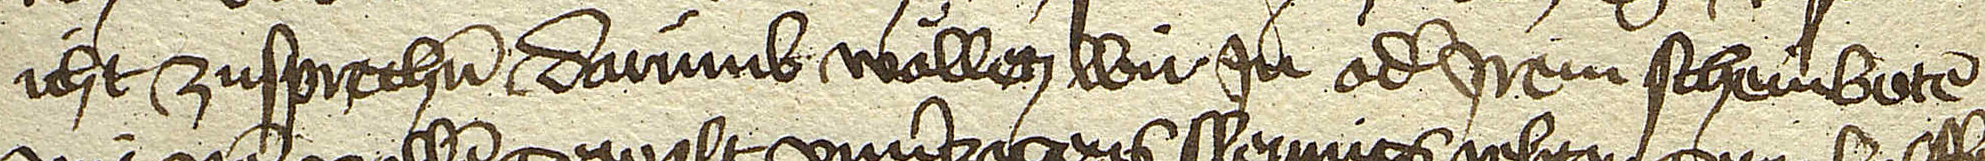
icht cʒuſprechn* / Darümb wöllen wir In od* Irem ſcheinbote*
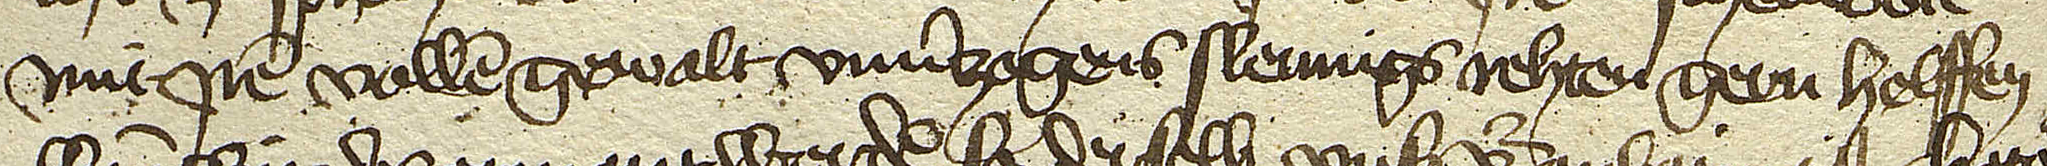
mit Ire* volle* gewalt vnu*cʒogens ſleunigs rehten gern helffen
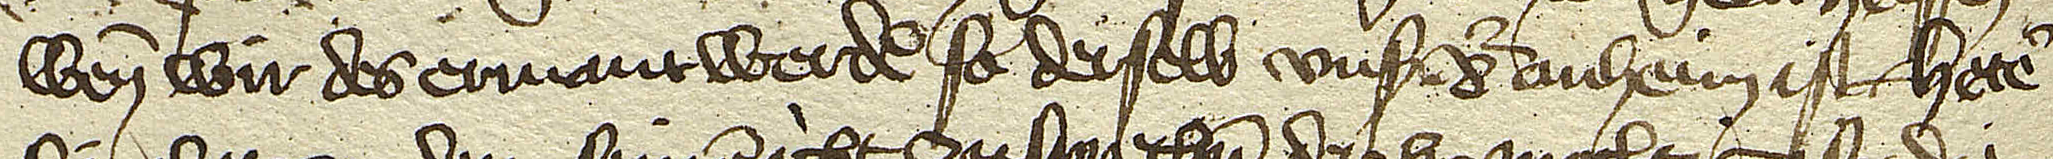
wen* wir des ermant werde* ſo derſelb vnſ* B* anheim iſt / hete*
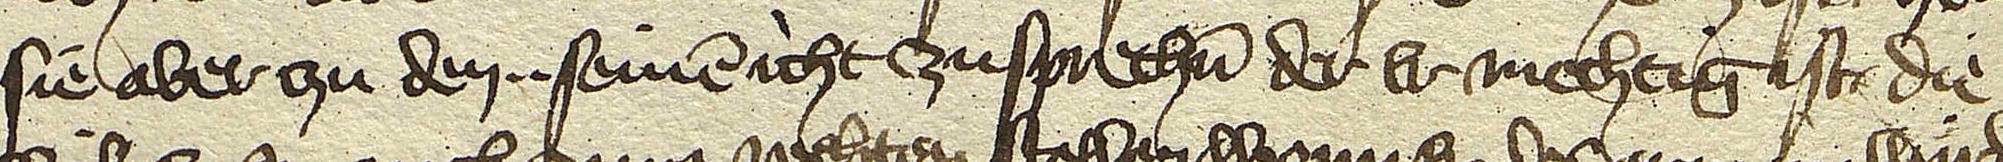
ſie aber cʒu den ~ ſeine* icht cʒuſprechn* der Er mechtig iſt / die
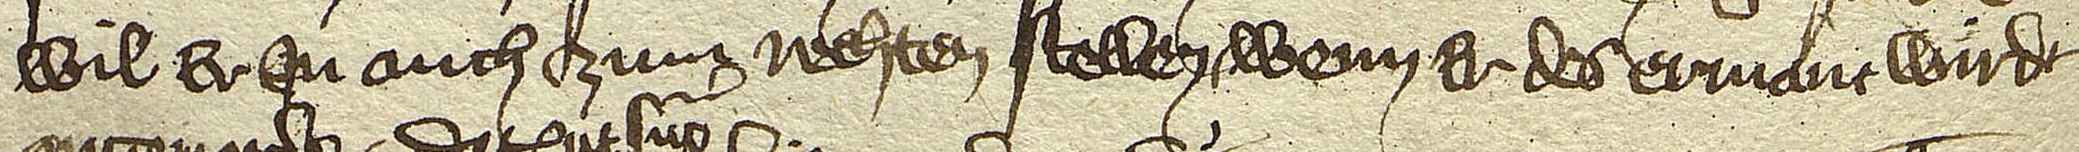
wil Er In auch cʒum nechten ſtellen / wenn Er des ermant wirdt
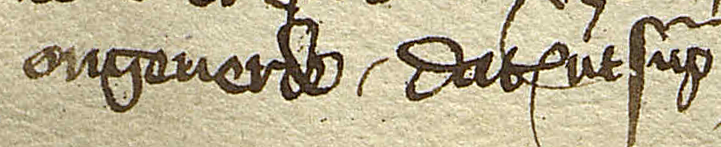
ongeuerde / dat* ut ſup*
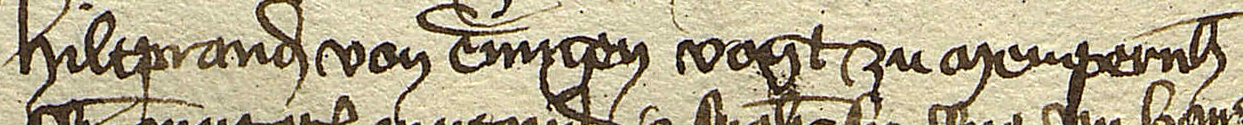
hiltprand* von Tüngen vogt cʒu Meinpernh*
